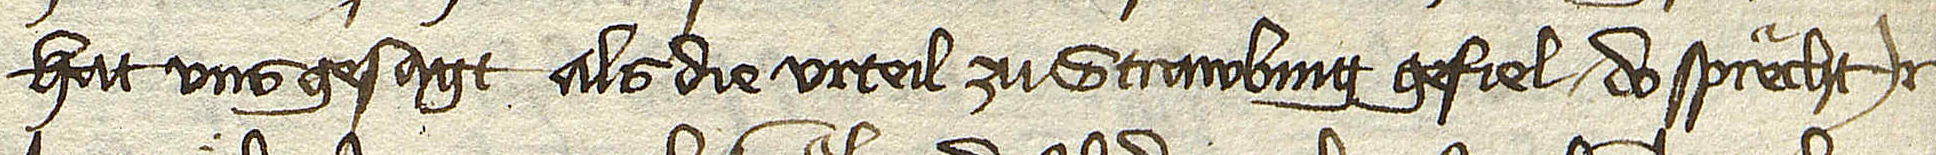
hat vns geſagt als die vrteil ʒu Strawburg gefiel / do ſprëcht Ir
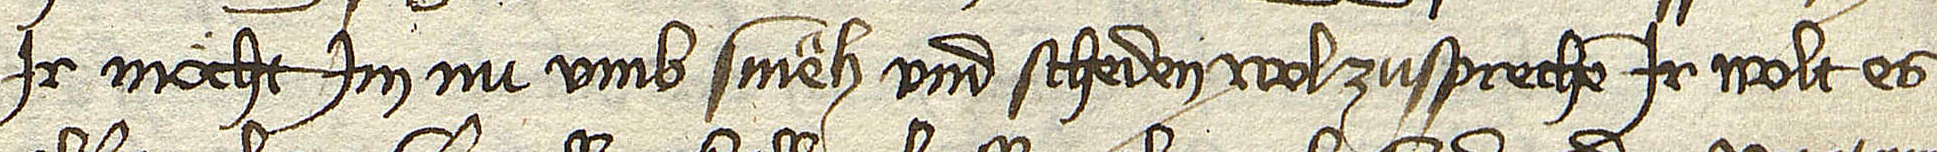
Ir möcht Im nu vmb ſmëh vnd ſcheden wol ʒuſpreche* Ir wolt es
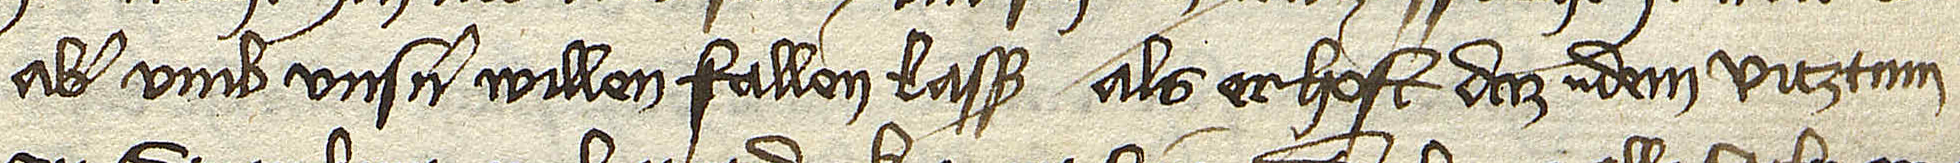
ab* vmb vnſ*n willen fallen laſſ* als er hoft daʒ ~ dem vicʒtum
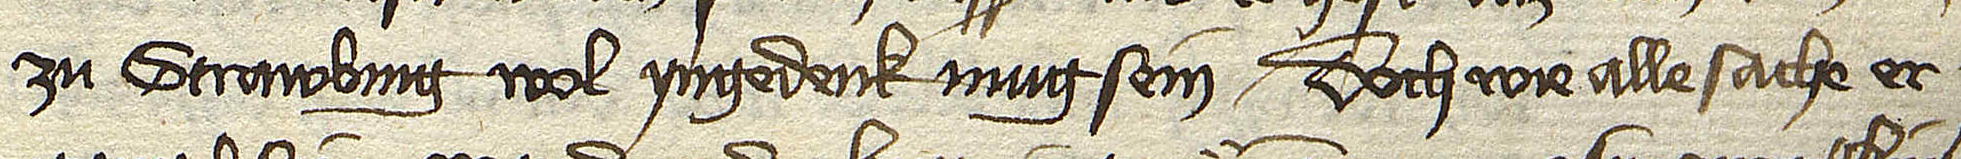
ʒu Strawbing wol yngedenk mug ſein / Doch wie alle ſache er -
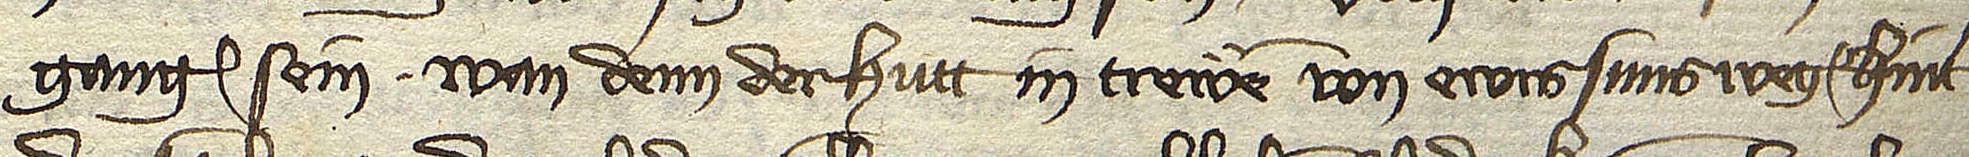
gang* ſein . wan denn der hutt in trewe* von ewrs ſuns weg* hint*
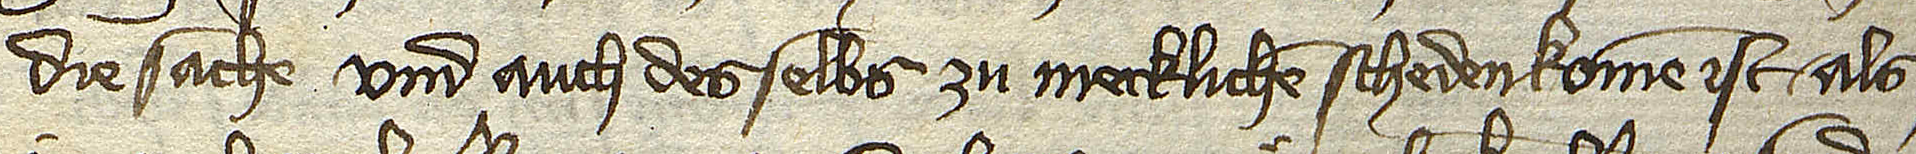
die ſache vnd auch des ſellbs ʒu merkliche* ſcheden kome* iſt / als
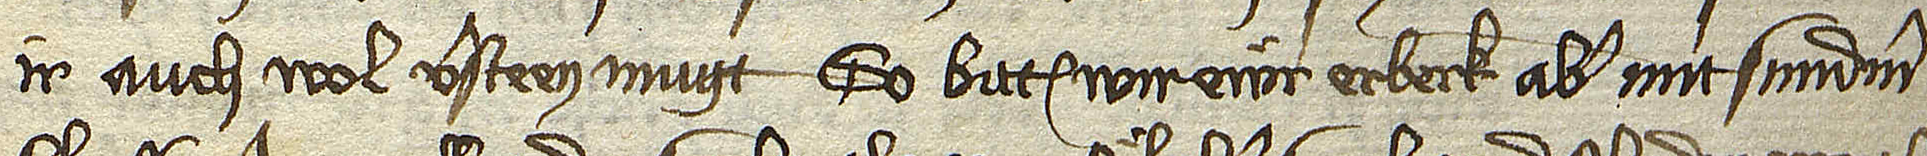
ir auch wol v*ſteen mugt So bitt* wir ewr erberk* ab* mit ſund*m
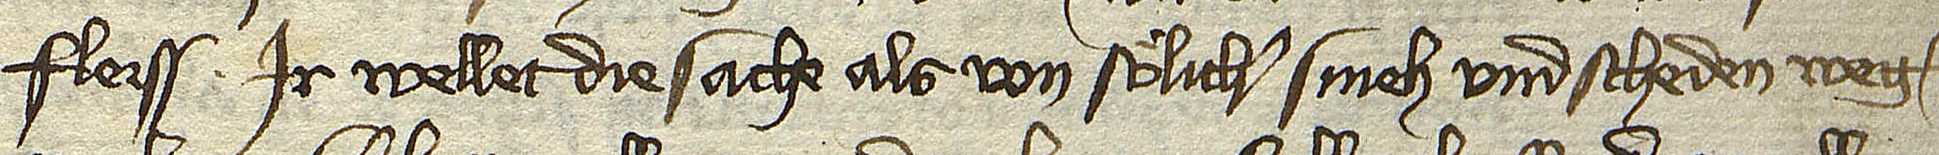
fleiſſ . Ir wellet die ſache als von ſölich* ſmeh vnd ſcheden weg*
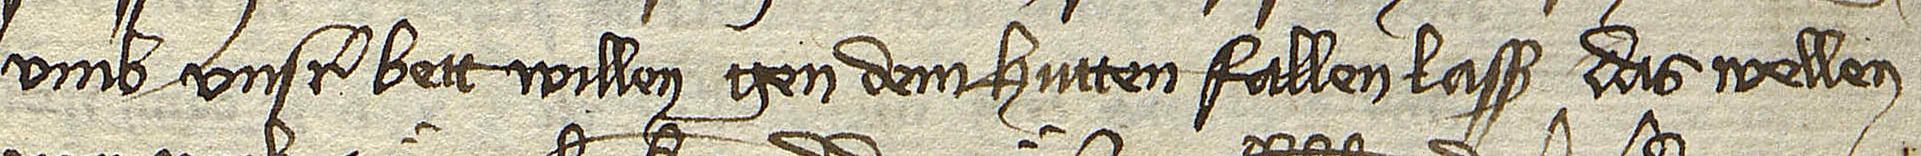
vmb vnſr* bett willen gen dem Hutten fallen laſſ* / das wellen
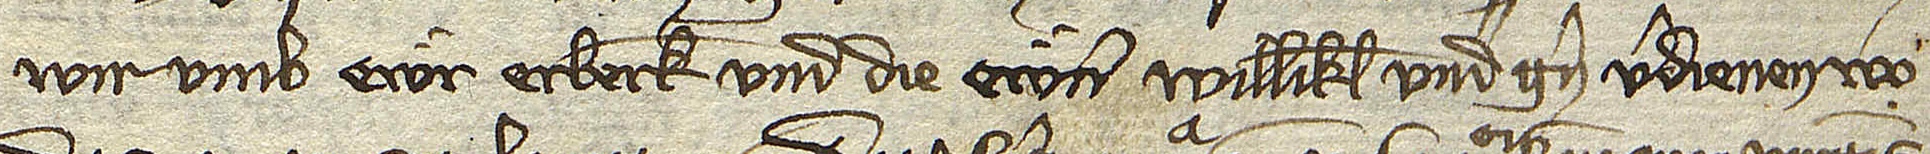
wir vmb ewr erberk* vnd die ewn* willikl* vnd gn* v*dienen wo
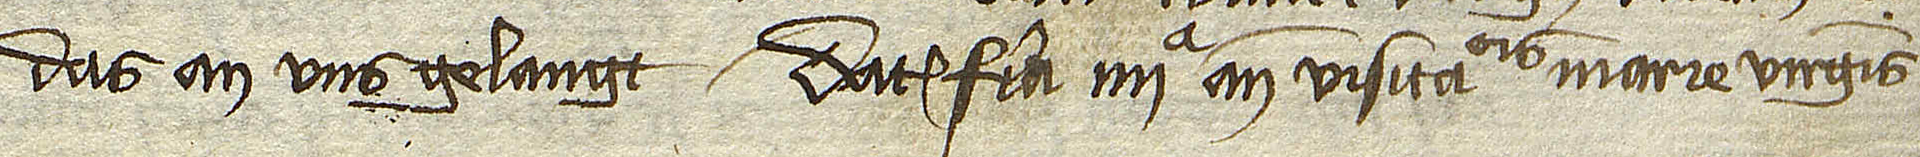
das an vns gelangt / Dat* fia* iiii* viſita* marie virgis*
